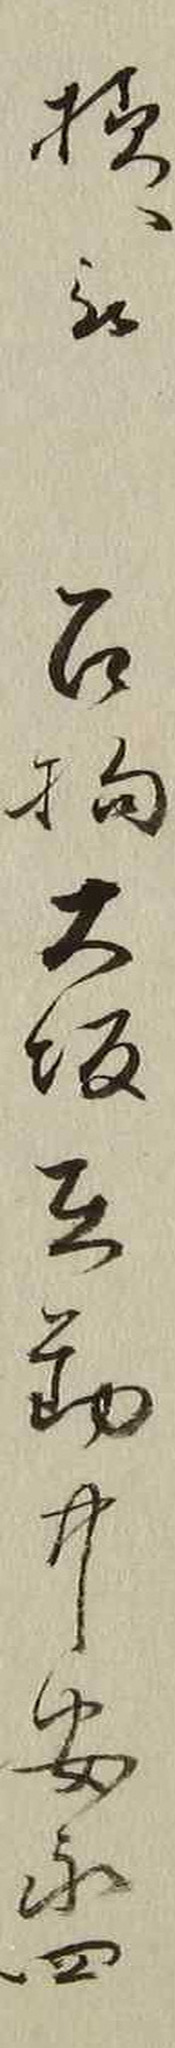様へ被召拘大坂在勤中安永四
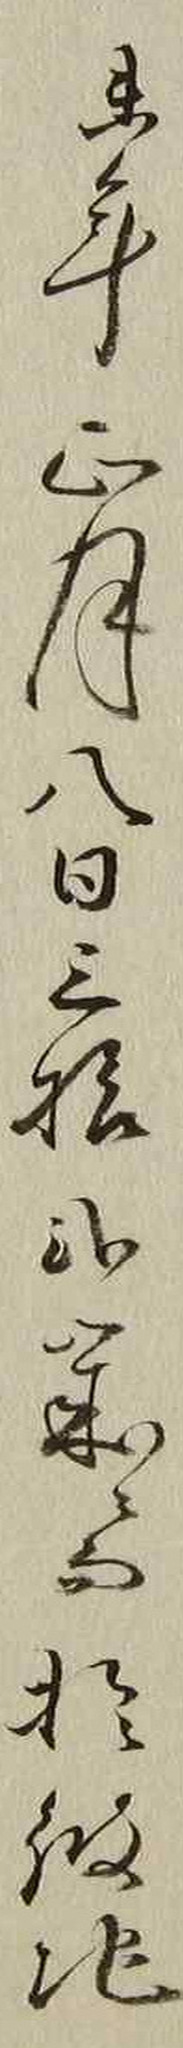未年正月八日三拾弐歳ニ而於彼地
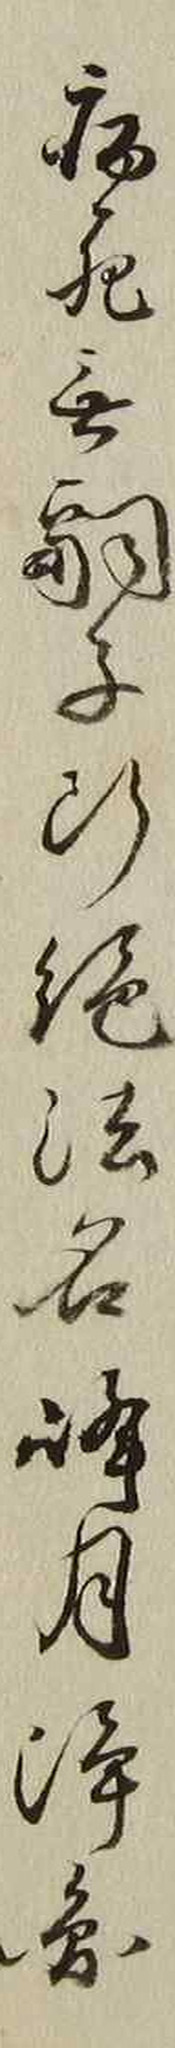病死無嗣子断絶法名峰月浄円
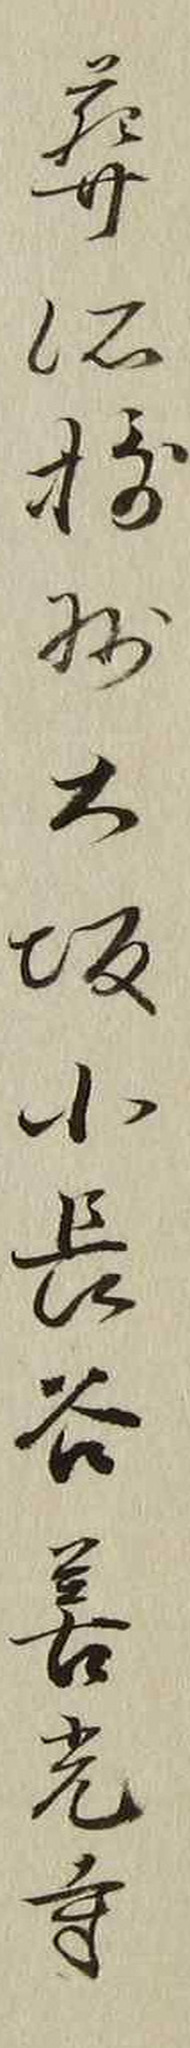葬所摂州大坂小長谷善光寺
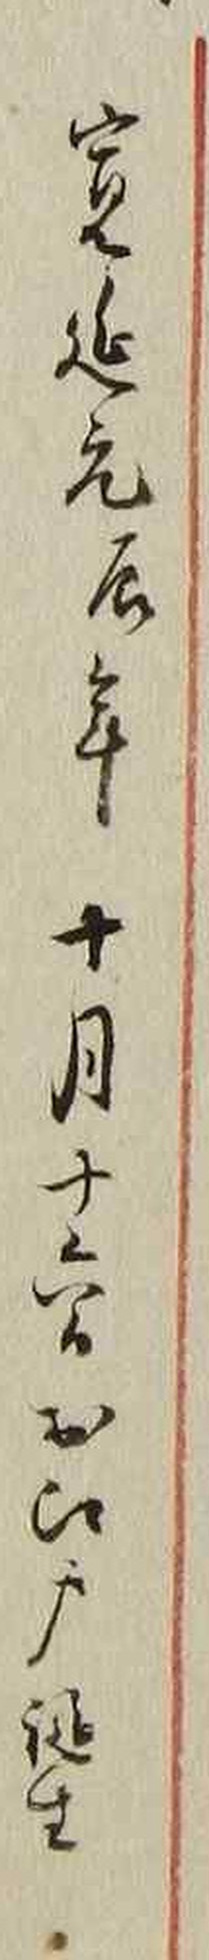寛延元辰年十月十六日於江戸誕生
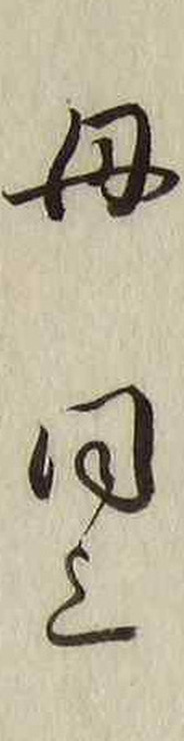母同上

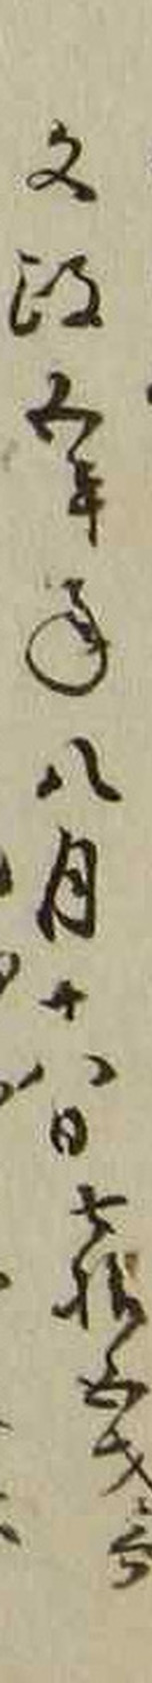文政五午年八月十八日七拾五才ニ而
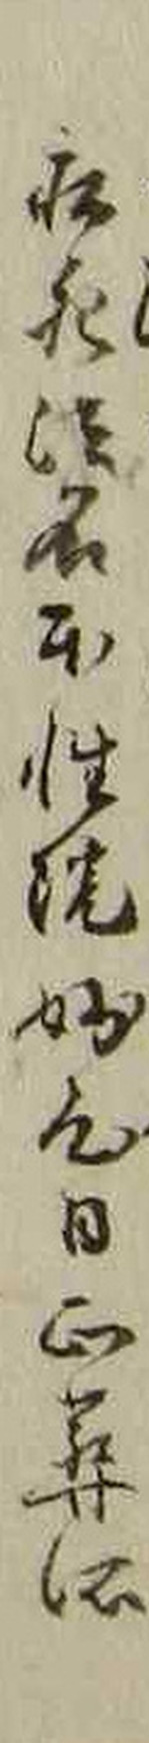病死法名本性院妙心日正葬所
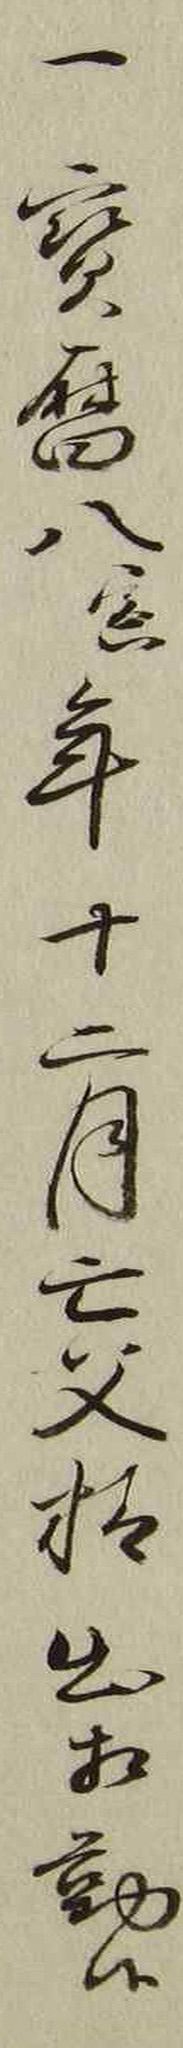一宝暦八寅年十二月亡父精出相勤候
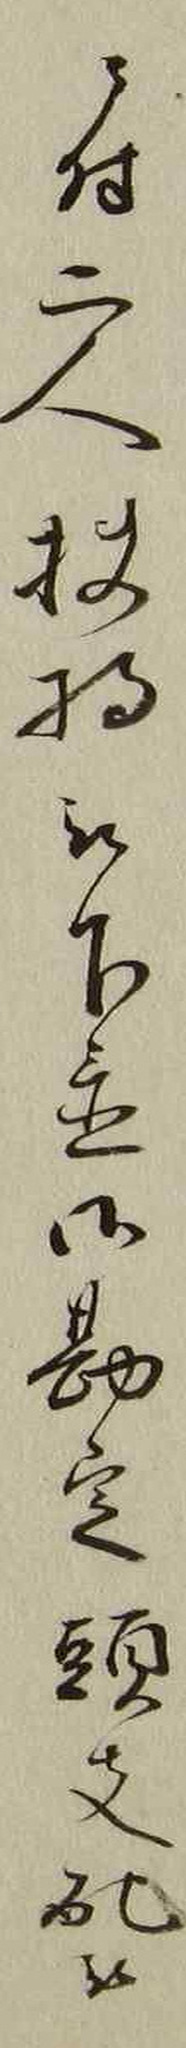ニ付二人扶持被下置御勘定頭支配被
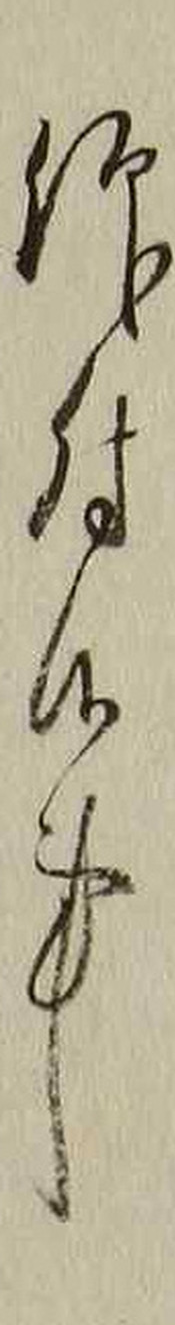仰付候事
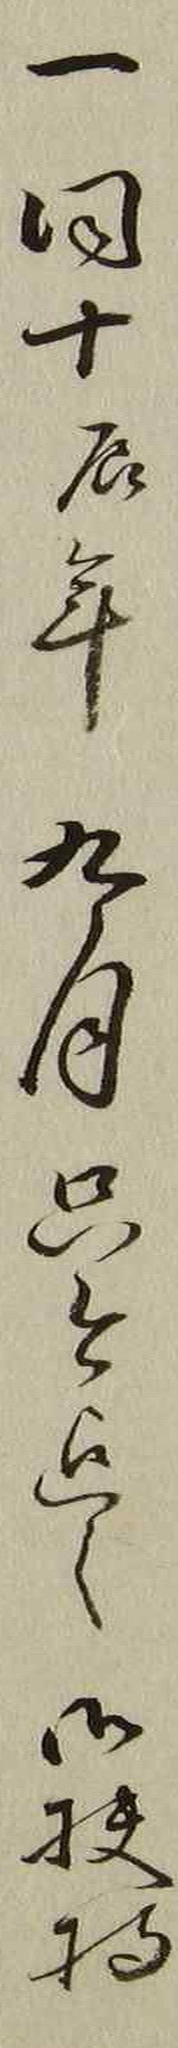一同十辰年九月只今迄之御扶持
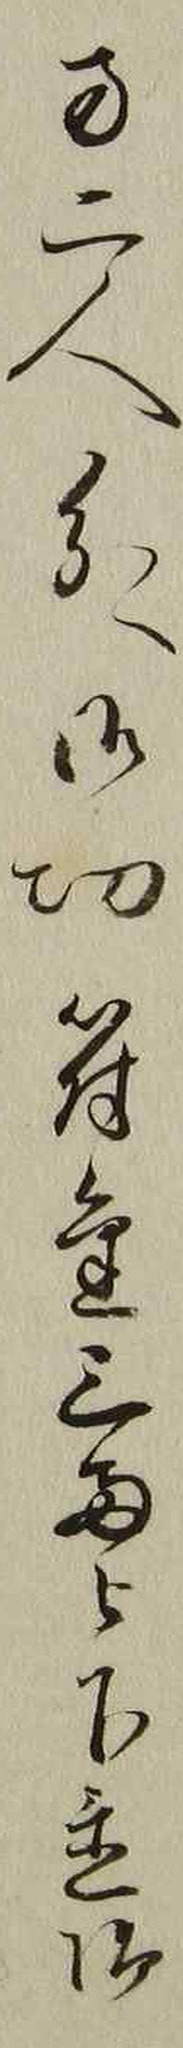方二人分へ御切符金三両被下置御
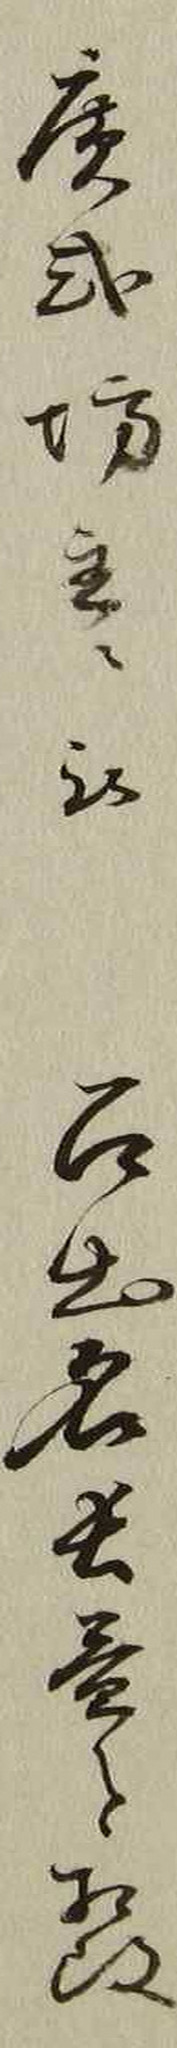広式坊主ニ被召出名長益と相改
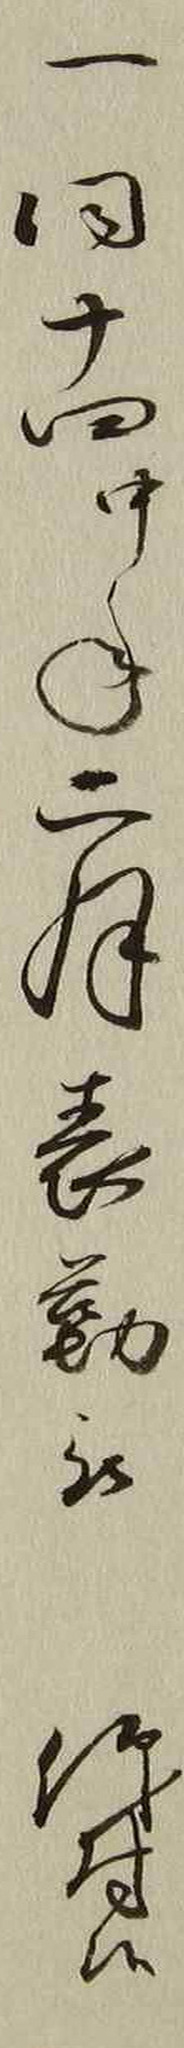一同十四申年二月表勤被仰付候
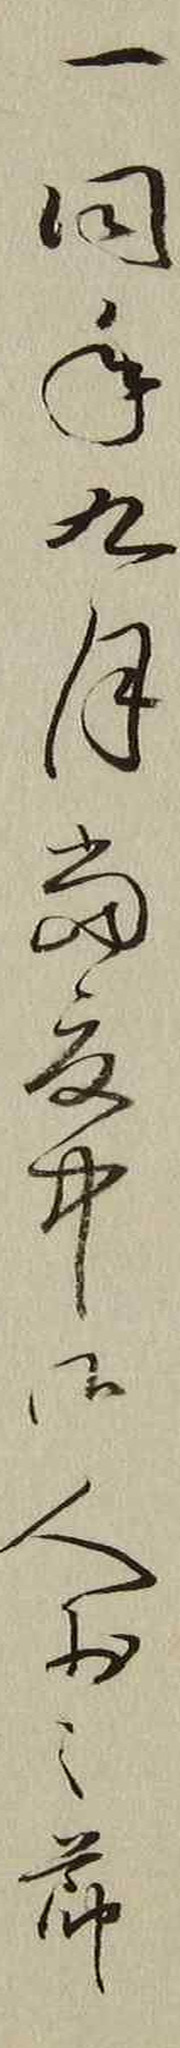一同年九月当夏中御人少之節
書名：諸士系譜　巻之4　い之部4
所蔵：会津若松市立会津図書館
